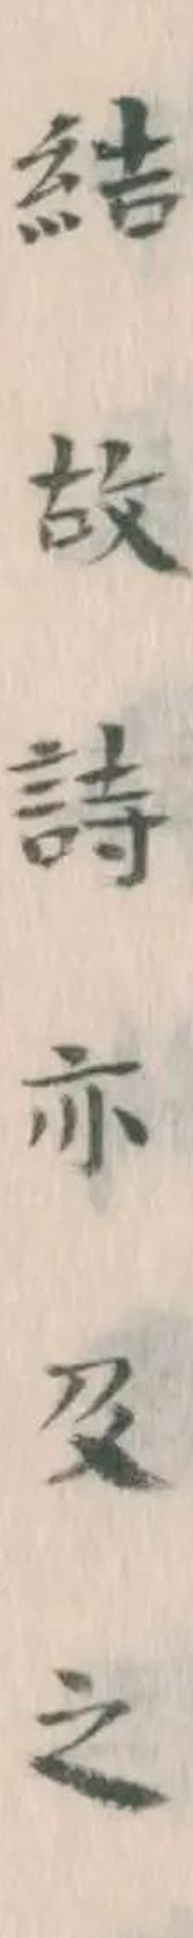結故詩亦及之
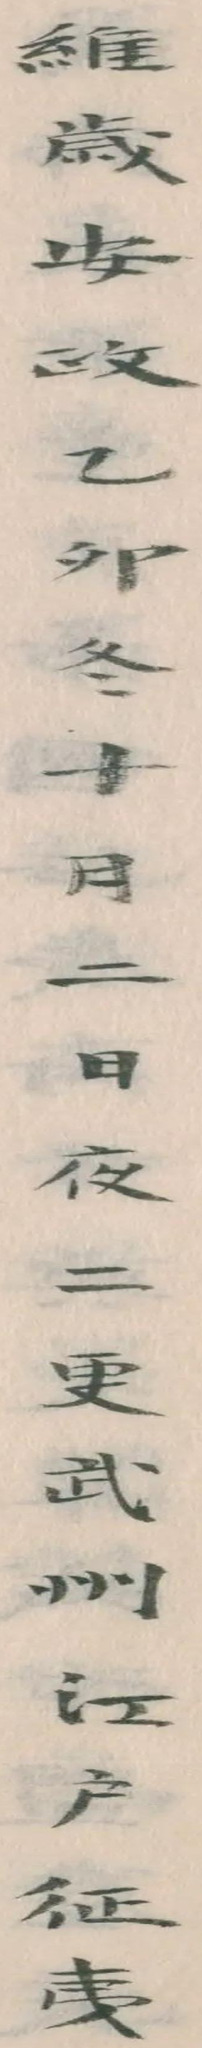維歳安政乙卯冬十月二日夜二更武州江戸征夷
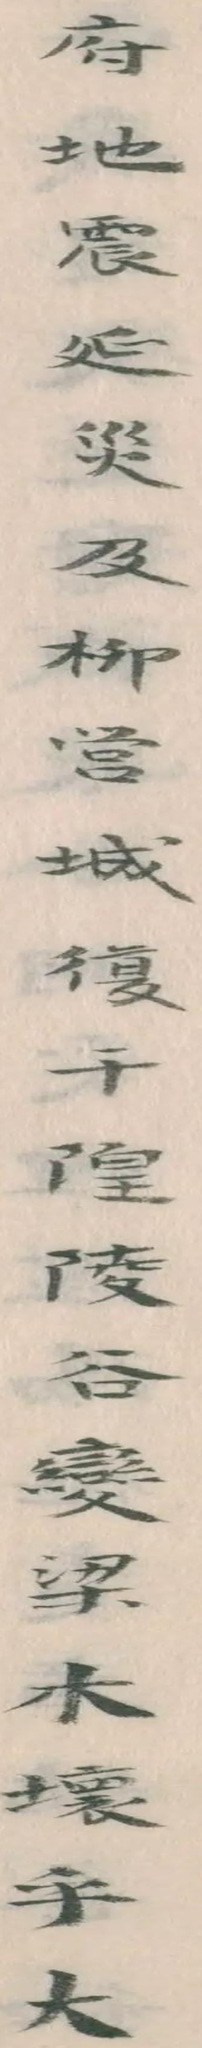府地震延災及柳営城復千隍陵谷變梁木壊乎大
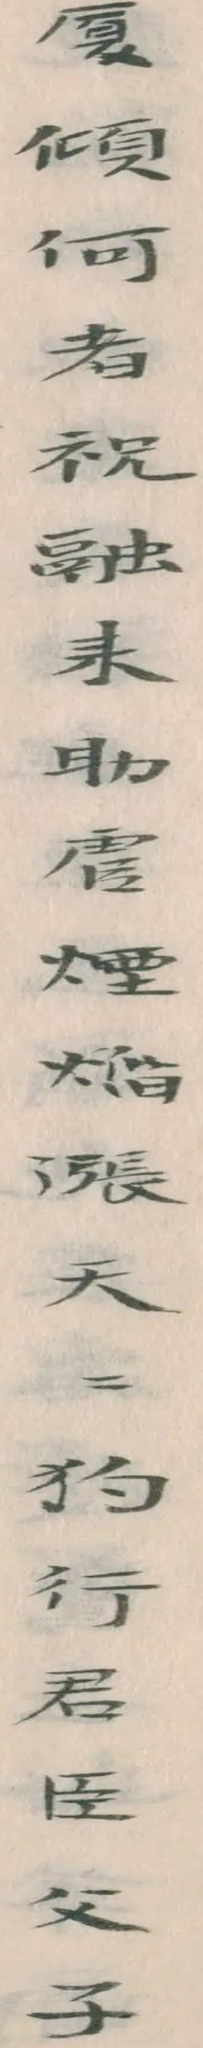厦傾何者祝融来助虐煙㷔漲天ニ犳行君臣父子
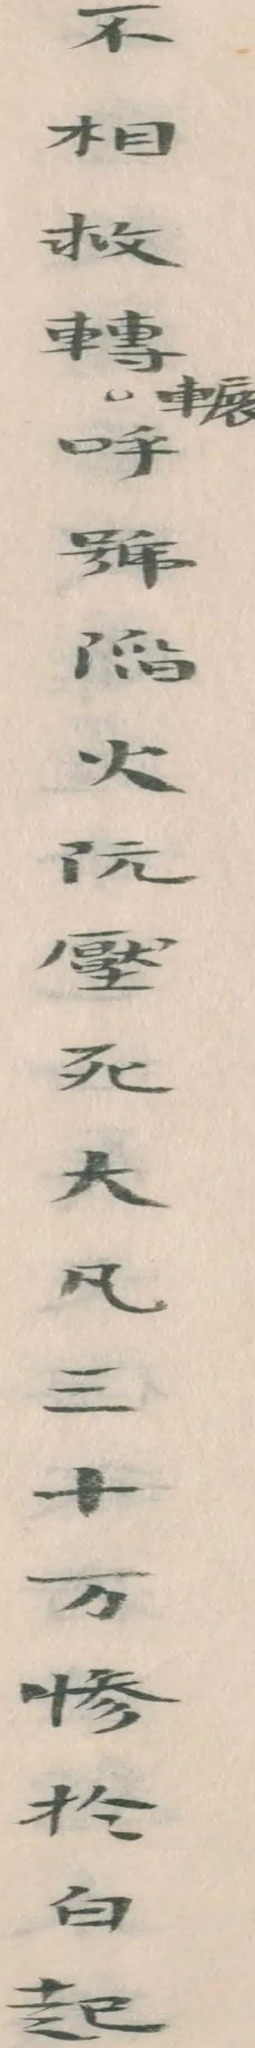不相救轉輾呼陥火阬壓死大凡三十万惨扵白起
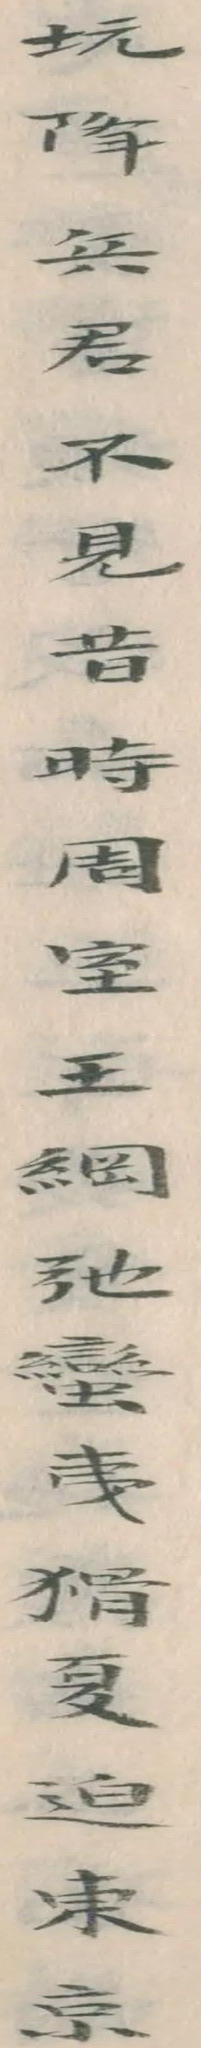坑降兵君不見昔時周室王綱弛蠻夷猾夏迫東京

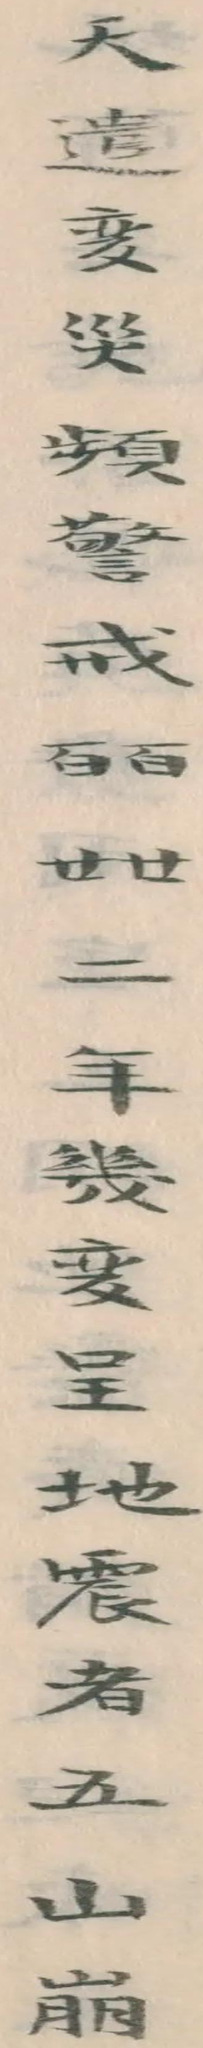天遣変災頻警戒皕𠦜二年幾変呈地震者五山崩
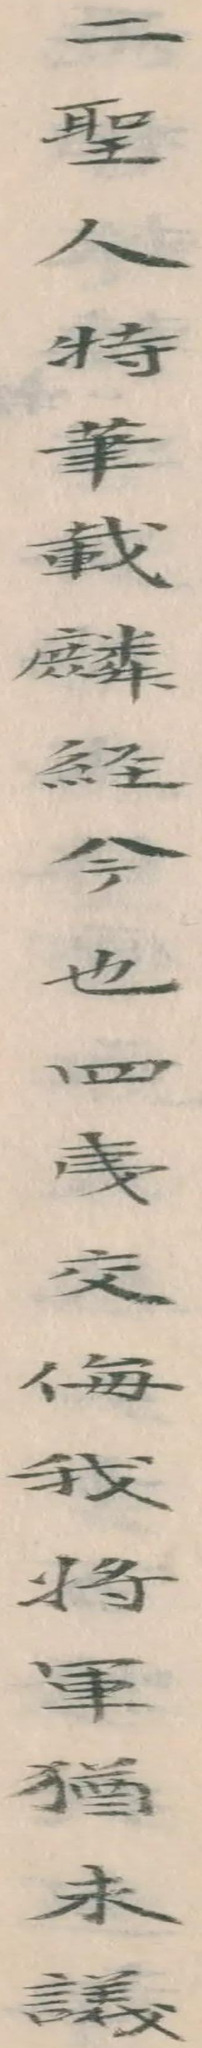二聖人特茟載麟経今也四夷交侮我將軍猶未議
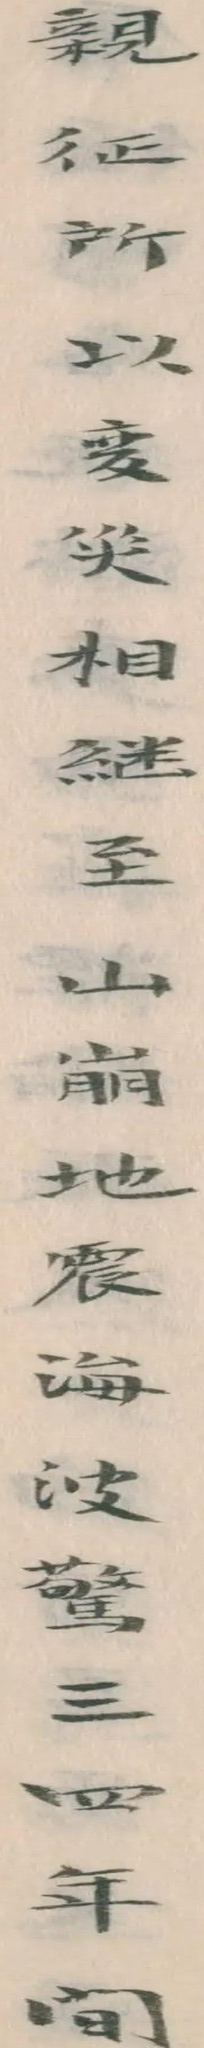親征所以変災相継至山崩地震海波驚三四年間
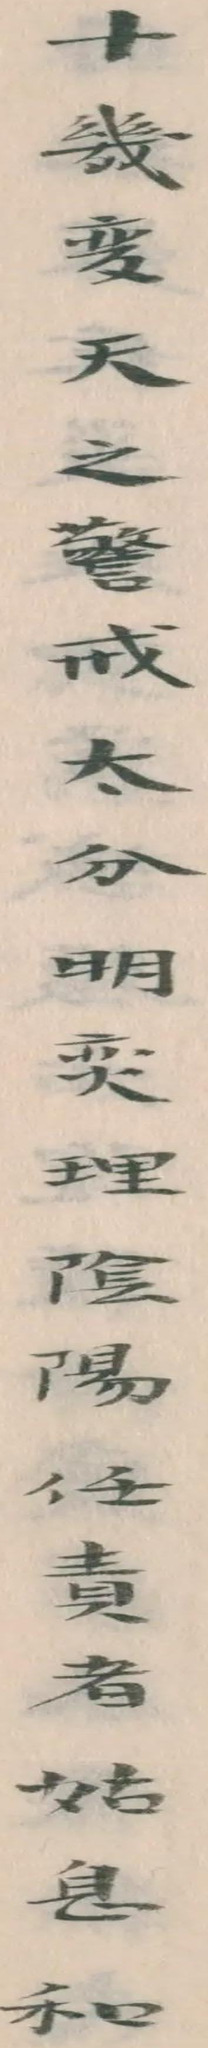十幾変天之警戒太分明理陰陽任責者姑息和
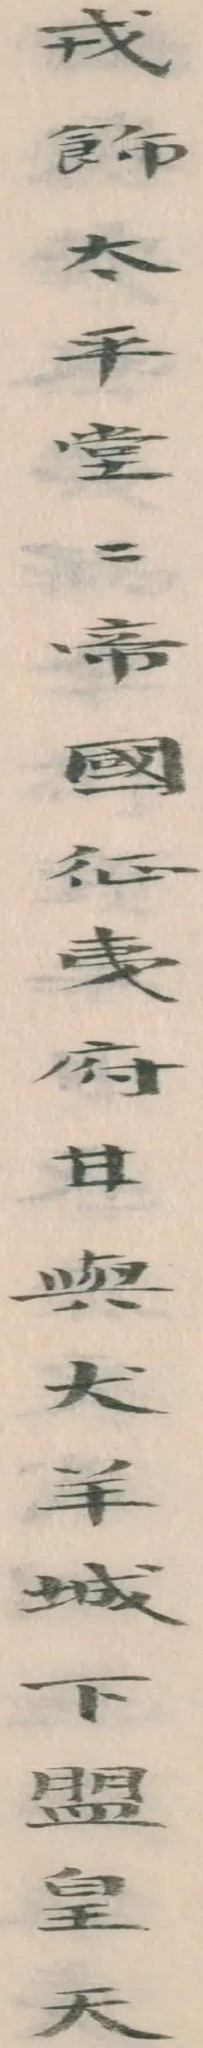戎飾太平堂ニ帝國征夷府甘與犬羊城下盟皇天
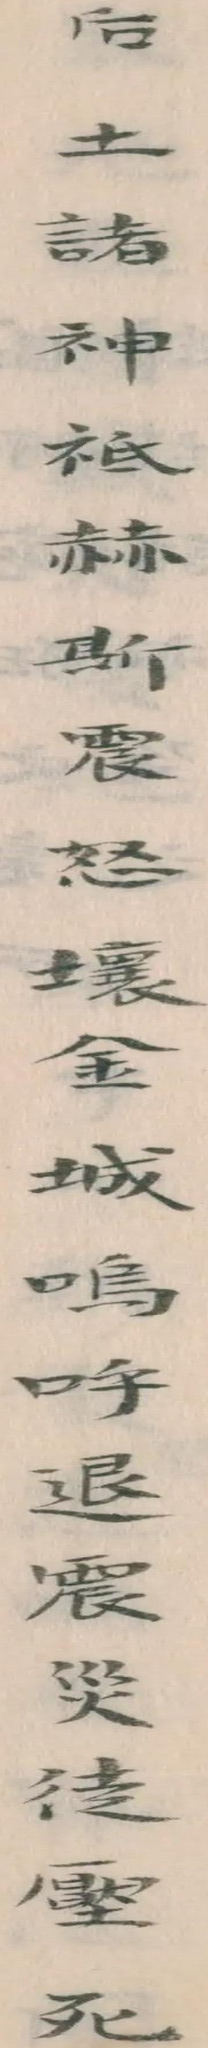后土諸神祗赫斯震怒壤金城嗚呼退震災徒壓死
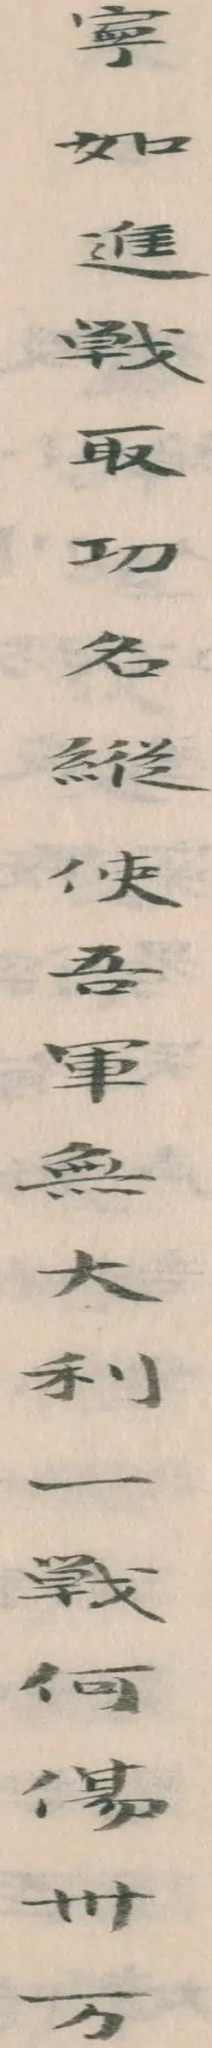寧如進戦取功名縦使吾軍無大利一戦何傷卅万
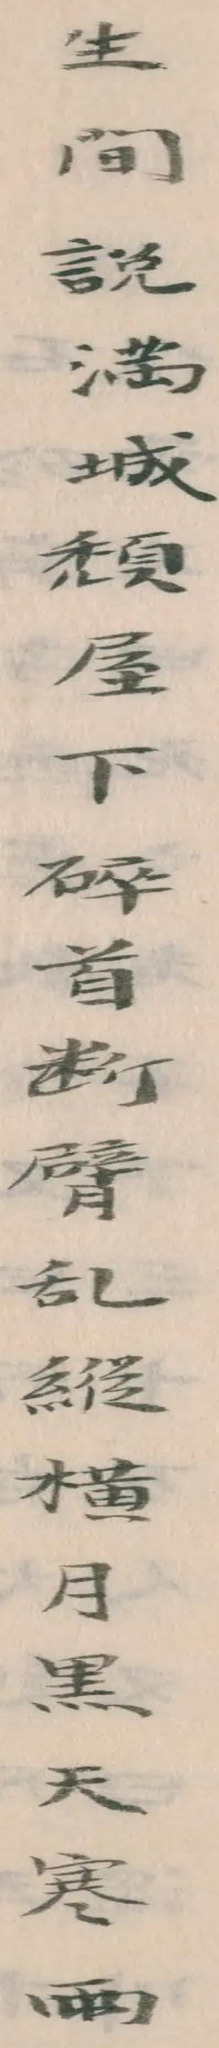生間説満城頽屋下碎首断臂乱縦横月黒天寒雨
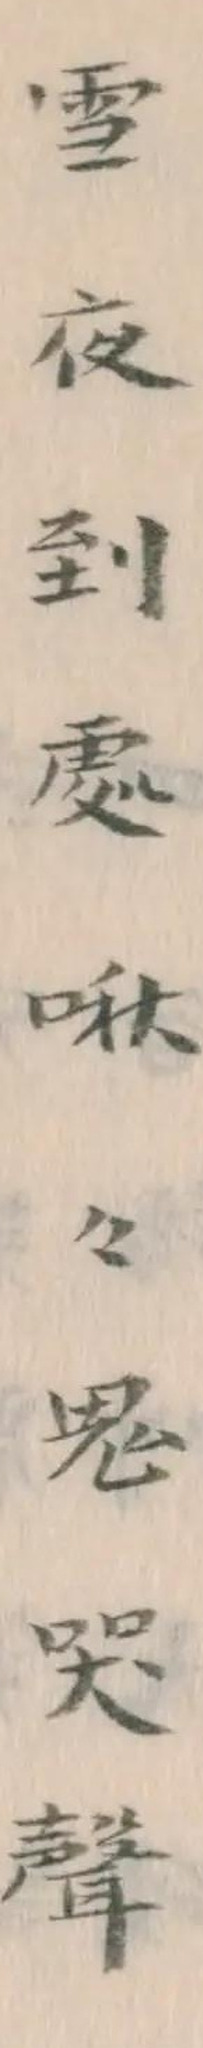雪夜到處啾々鬼哭聲
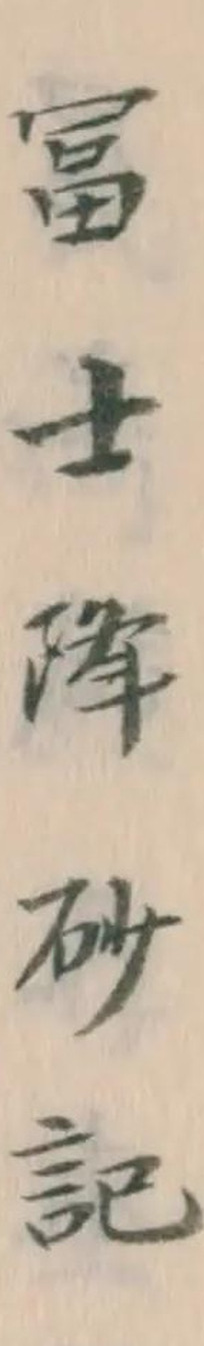冨士降砂記
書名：地災撮要. 巻11-12(地震之部)
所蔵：国立国会図書館 National Diet Library, JAPAN
